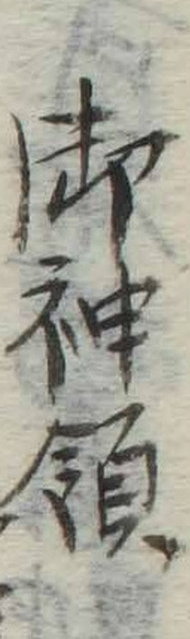御神領
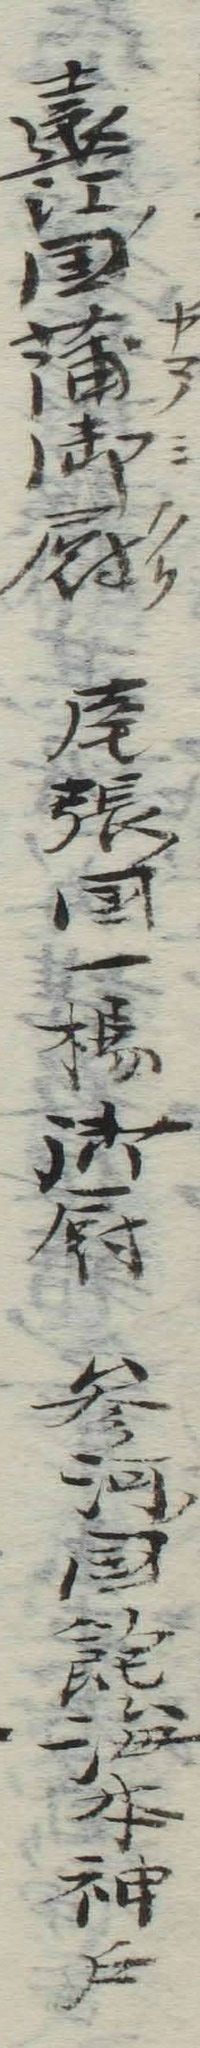遠江国蒲御厨尾張国一楊御厨参河国飽海本神戸
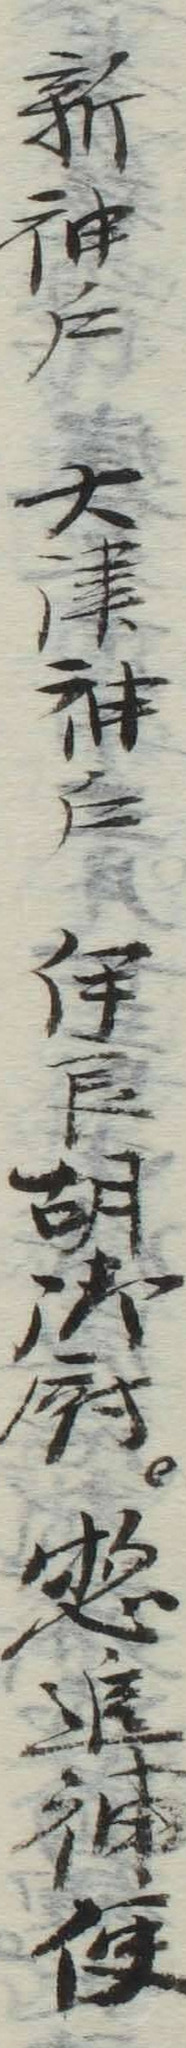新神戸大津神戸伊良胡御厨。惣追補使
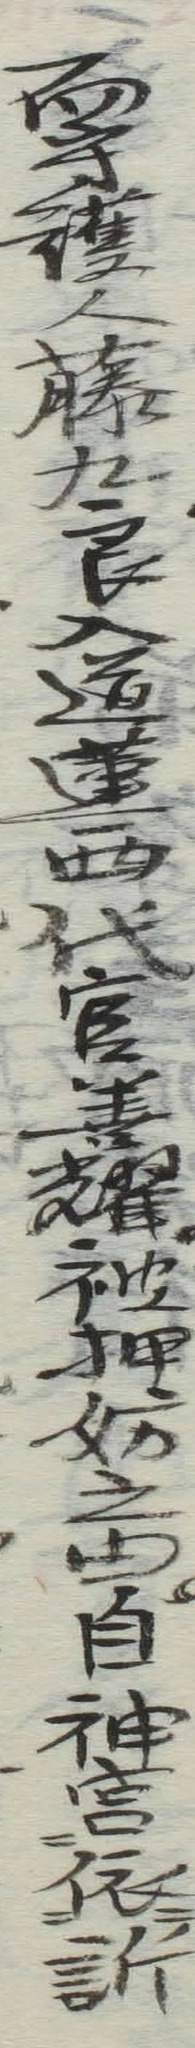而守護人藤九郎入道蓮西代官善耀。被押妨之由。自神宮依訴
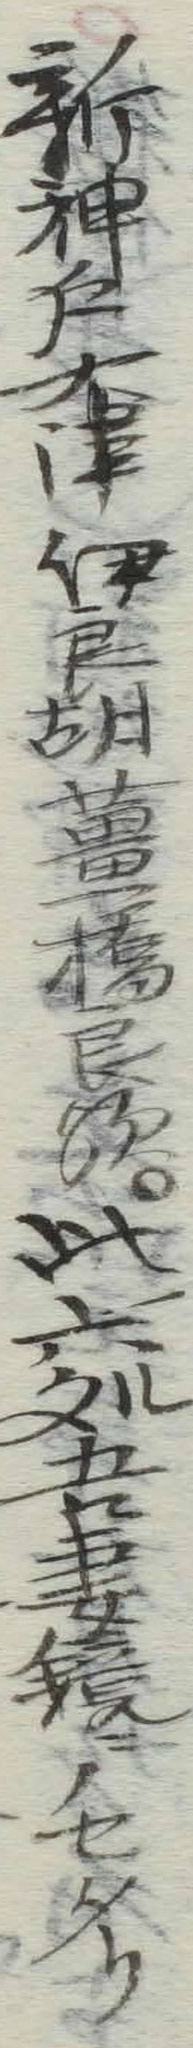新神戸大津伊良胡薑橋良歟。此六処吾妻鏡ニノセタリ

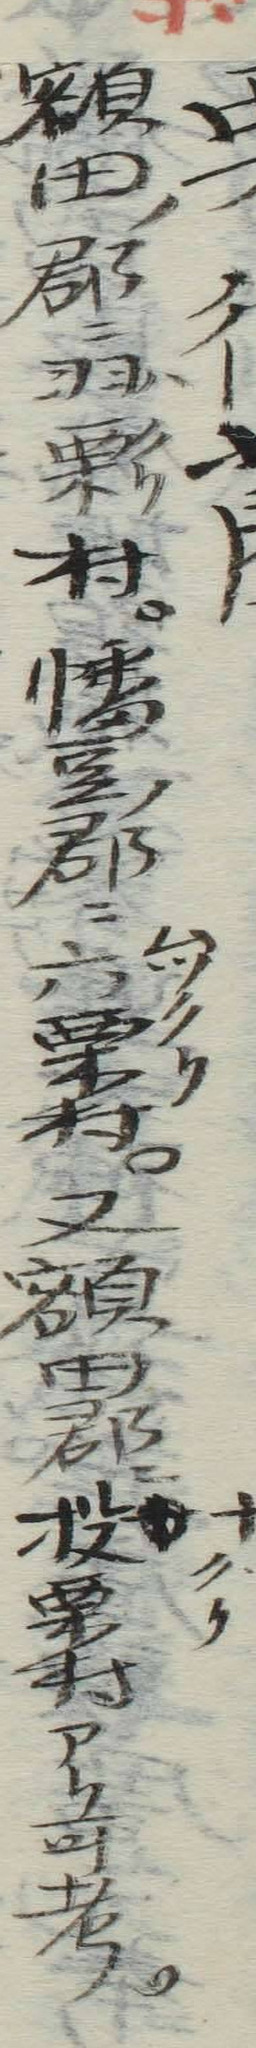○今額田郡ニ羽栗村。幡豆郡ニ六栗村。又額田郡投栗村アリ可考。
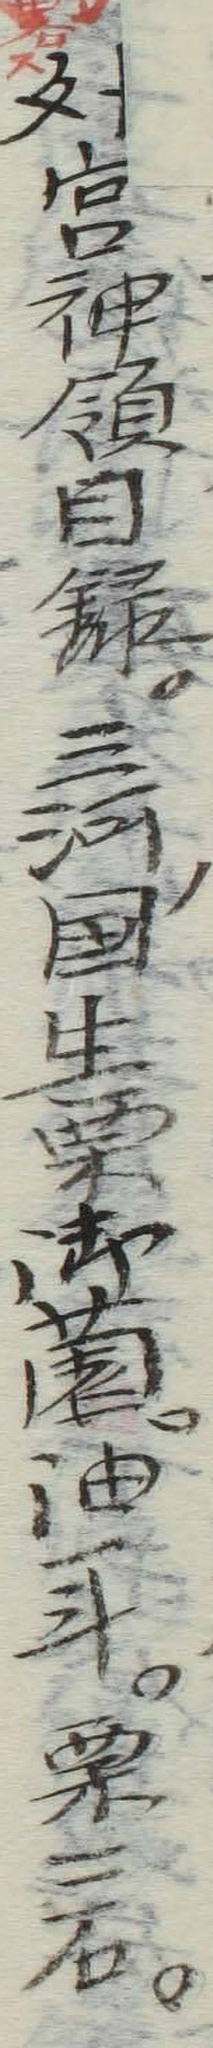○外宮神領目録。参河国生栗御薗。油一斗。栗二石。

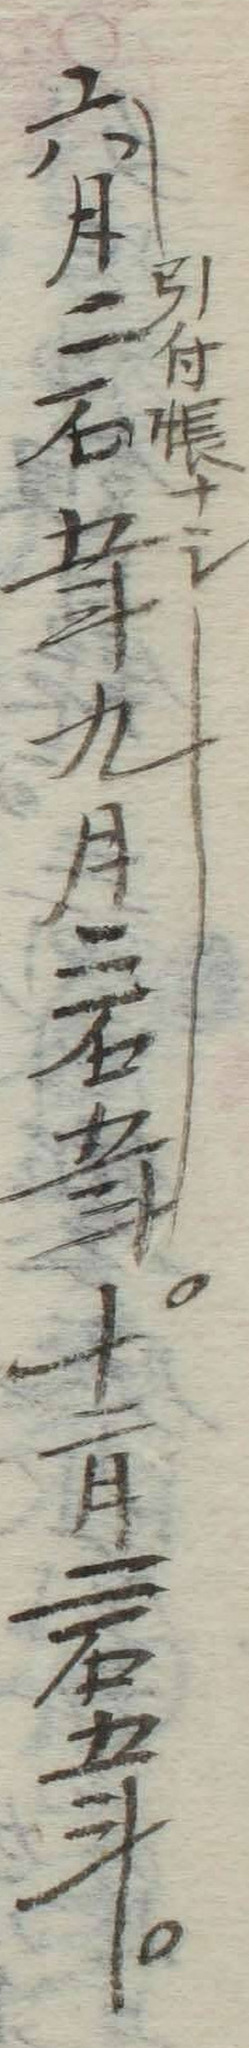六月二石五斗九月二石五斗。十二月二石五斗。
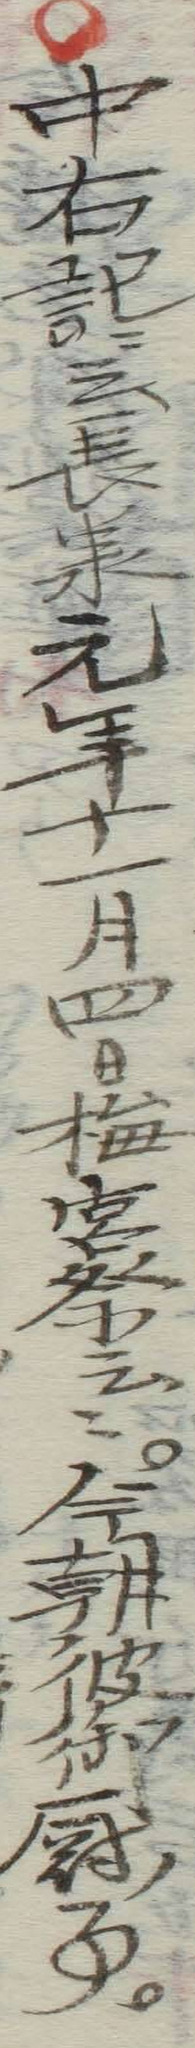○中右記ニ云長承元年十一月四日梅宮祭云々。今朝彼御御厨事。
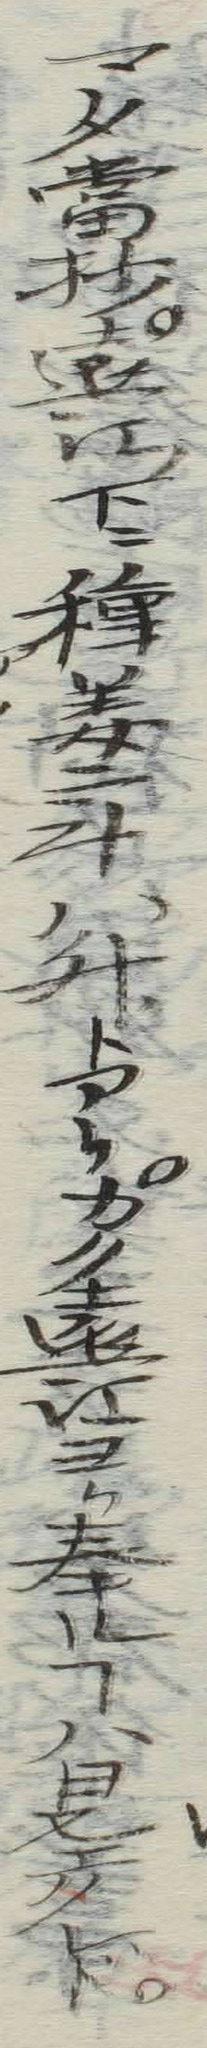マタ当抄。遠江下ニ種姜二斗八升トアリ。カク遠江ヨリ奉ルコトハ見エタレド。
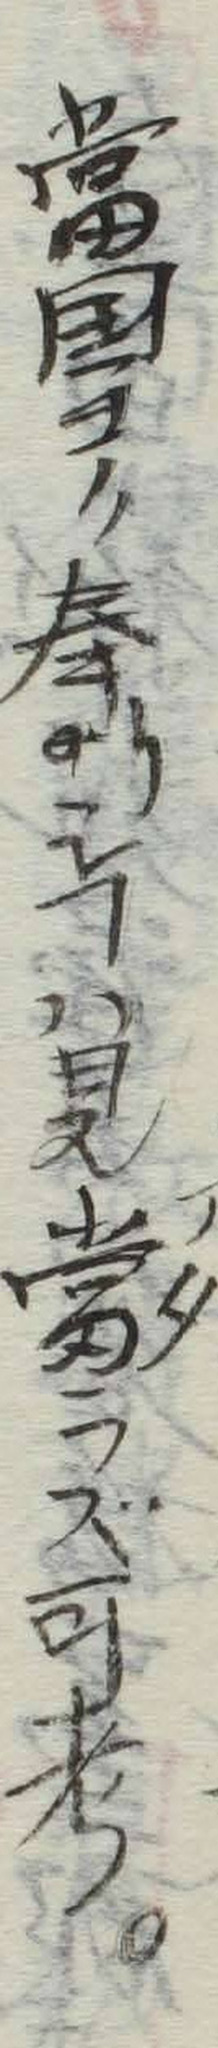当国ヨリ奉リシコトハ見当ラズ可考。
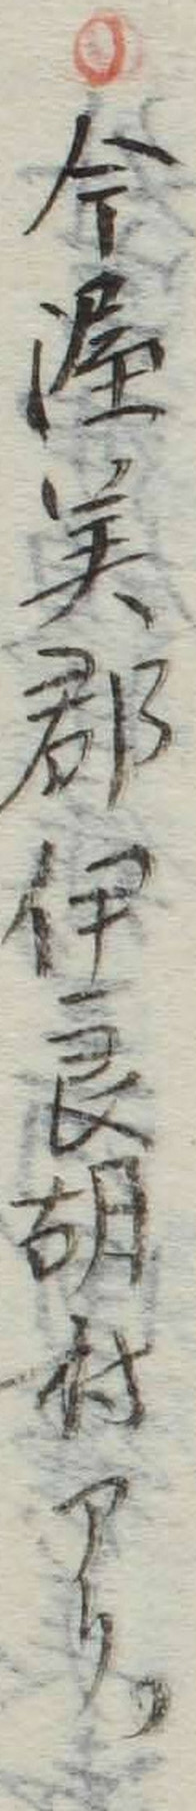○今渥美郡伊良胡村アリ。
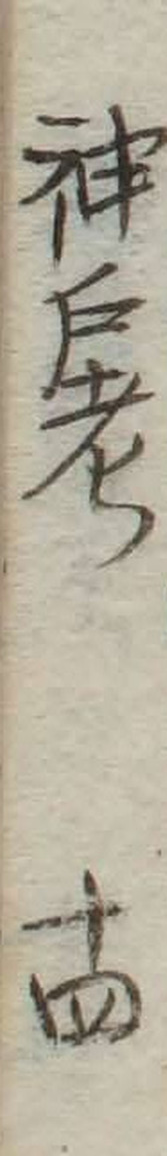神戸考十四

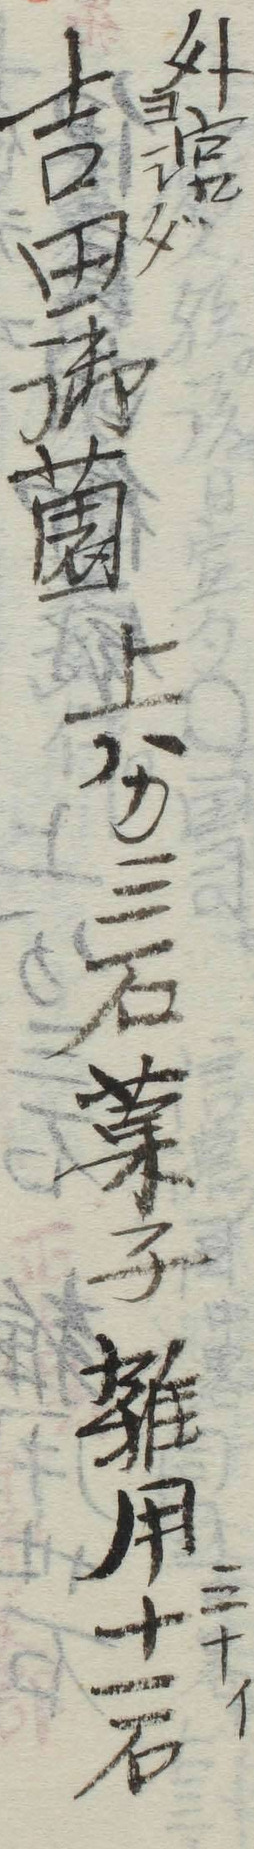吉田御薗上分三石菓子雑用十一石
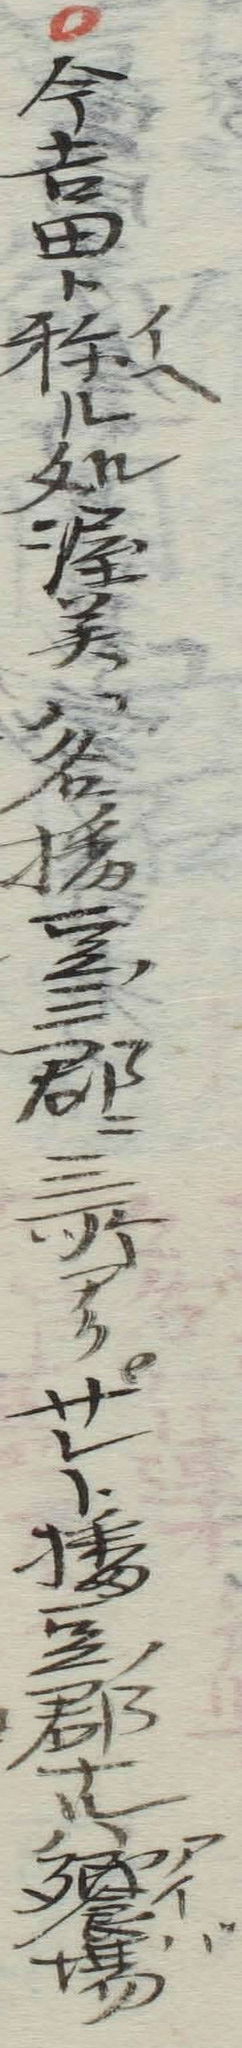○今吉田ト称ル処渥美八名幡豆三郡三所アリ。サレト幡豆郡ナルハ饗場
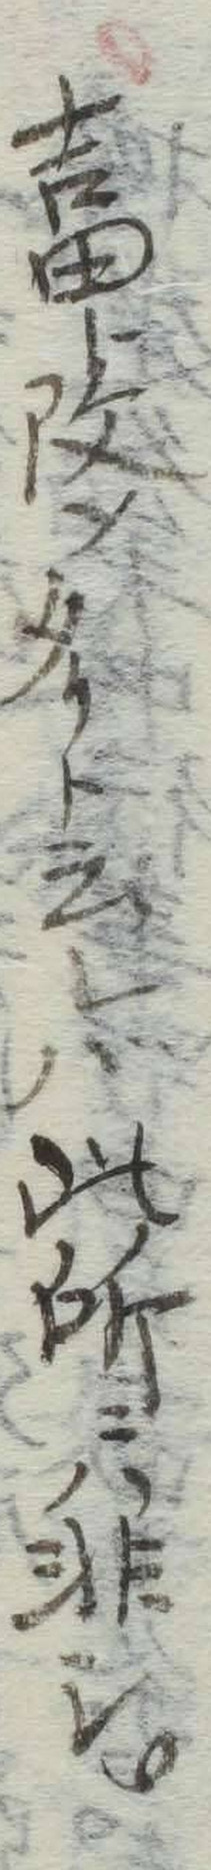吉田ト改メタリト云レバ此所ニハ非シ。
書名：神戸御厨御薗考
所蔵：国文学研究資料館
